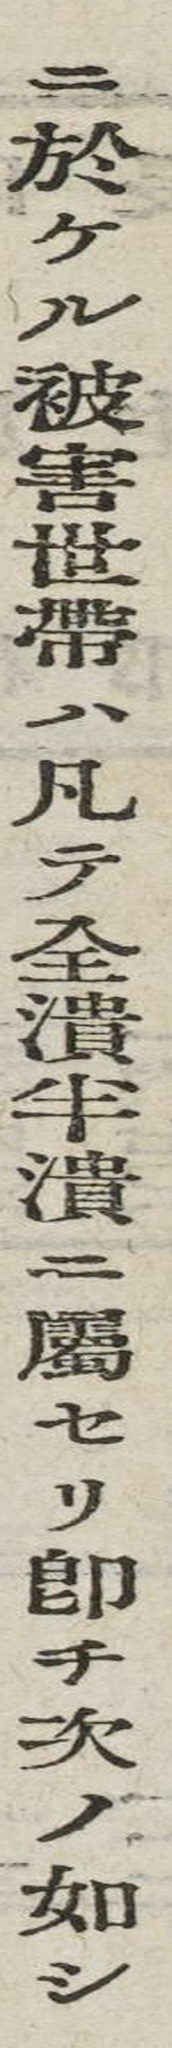ニ於ケル被害世帯ハ凡テ全潰半潰ニ属セリ即チ次ノ如シ
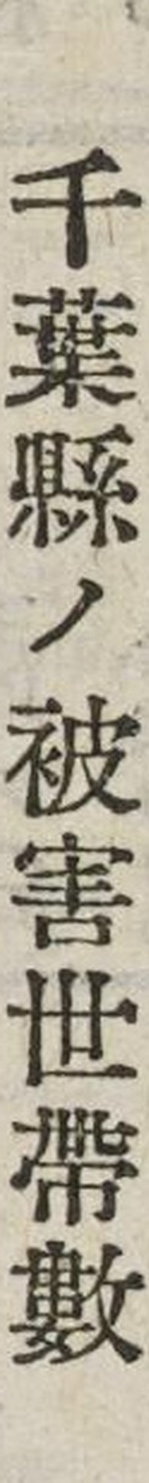千葉県ノ被害世帯数

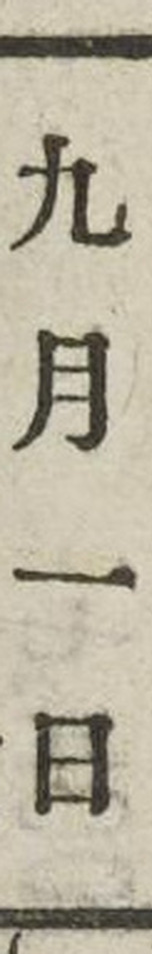九月一日
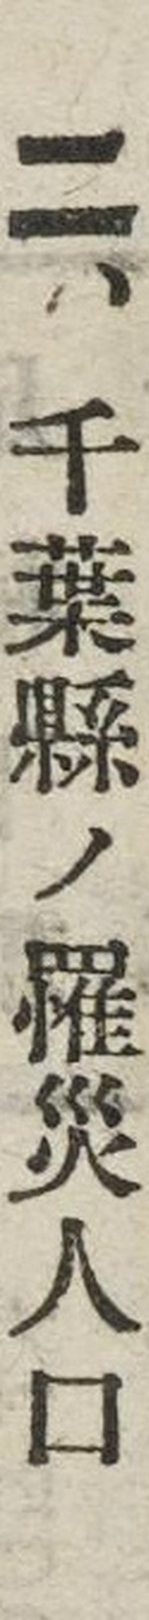二、千葉県ノ罹災人口
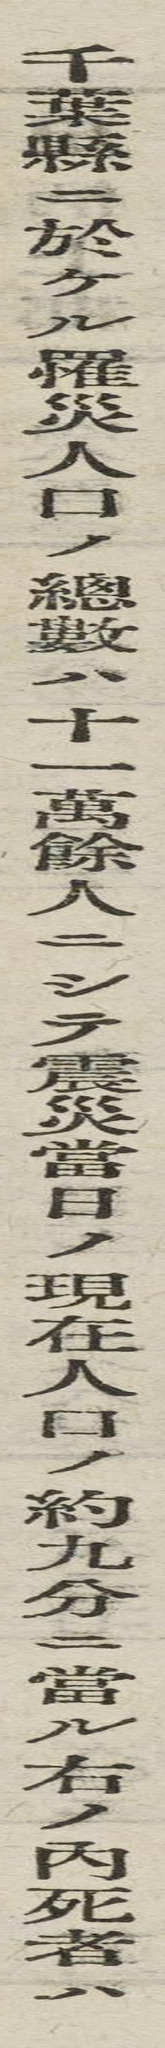千葉県ニ於ケル罹災人口ノ総数ハ十一万余人ニシテ震災当日ノ現在人口ノ約九分ニ当ル右ノ内死者ハ
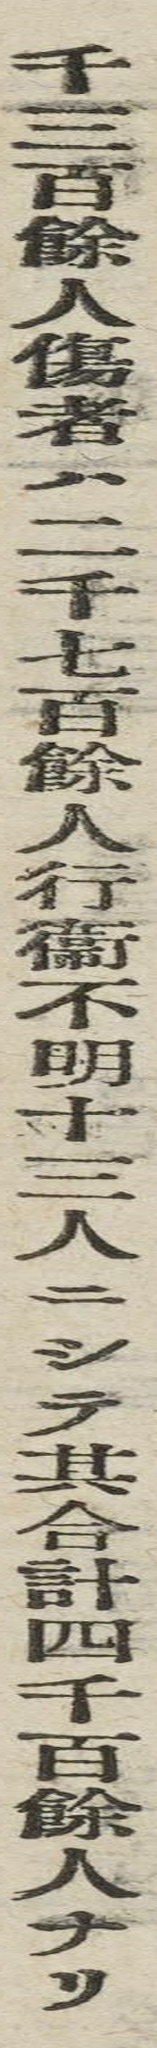千三百余人傷者ハ二千七百余人行方不明十三人ニシテ其合計四千百余人ナリ
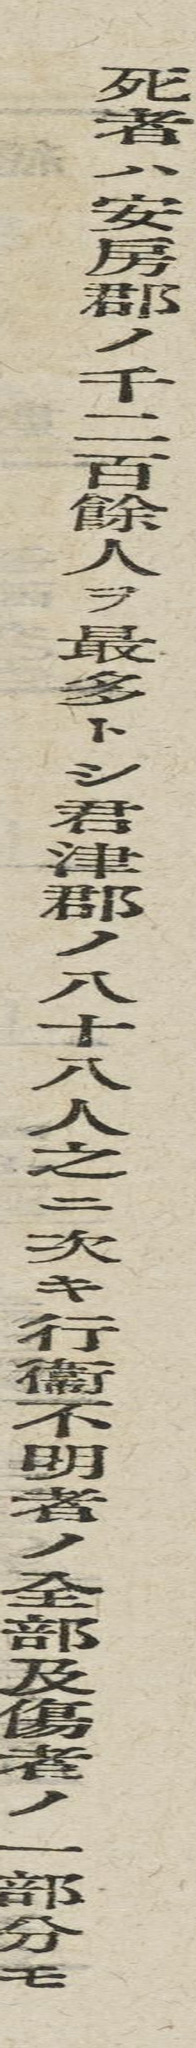死者ハ安房郡ノ千二百余人ヲ最多トシ君津郡ノ八十八人之に次キ行方不明者ノ全部及傷者ノ一部分モ
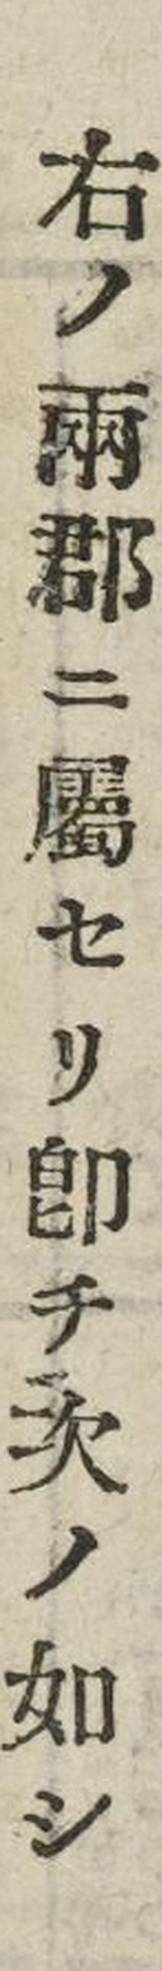右ノ両郡ニ属セリ即チ次ノ如シ
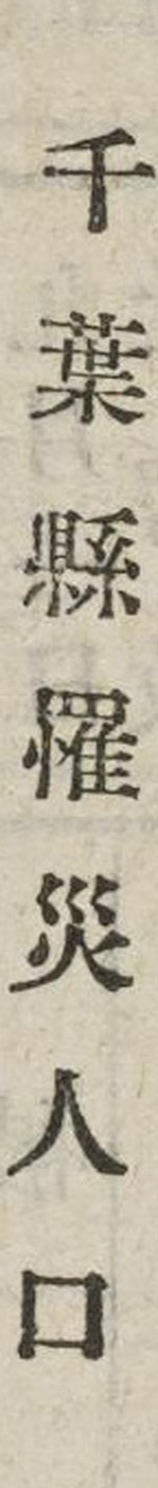千葉県罹災人口
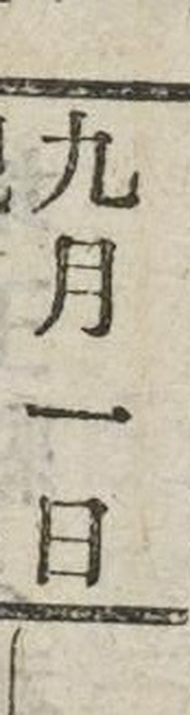九月一日

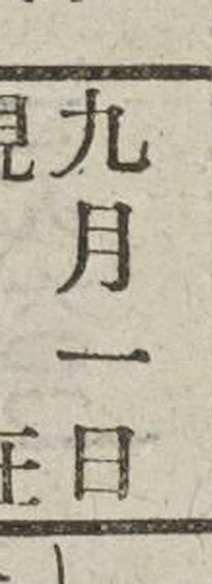九月一日
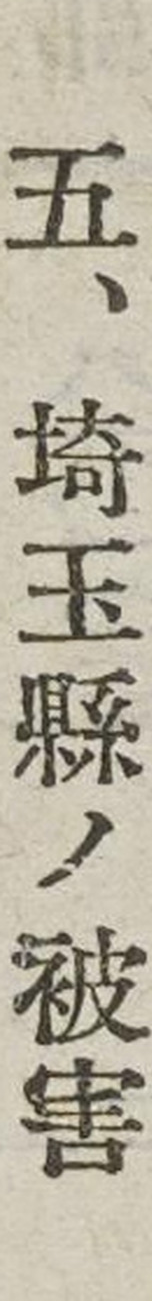五、埼玉県ノ被害
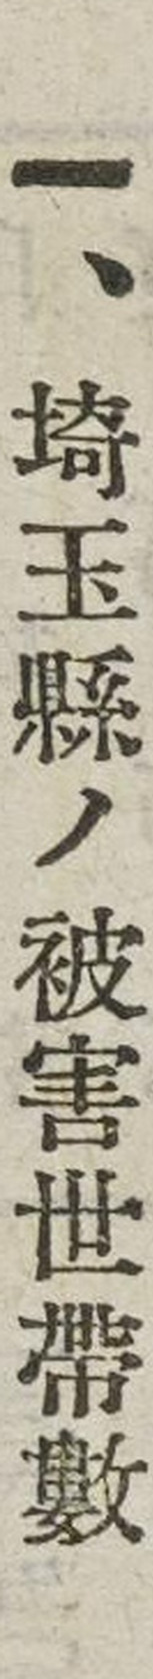一、埼玉県ノ被害世帯
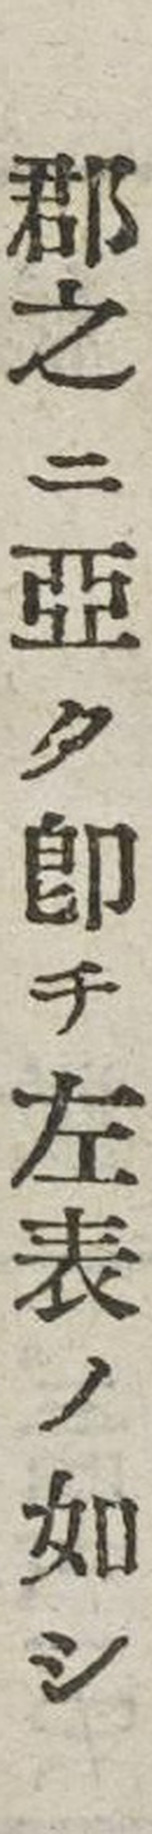郡之に亜ク即チ左表ノ如シ
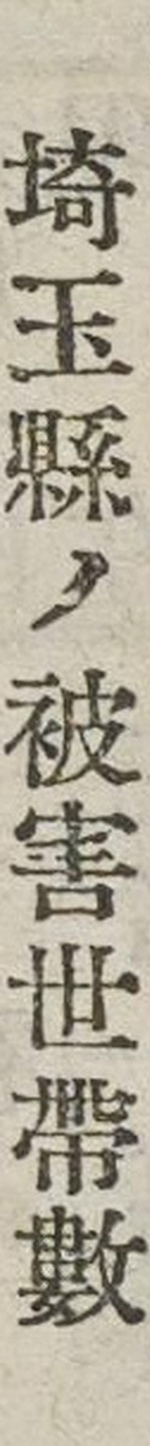埼玉県ノ被害世帯数
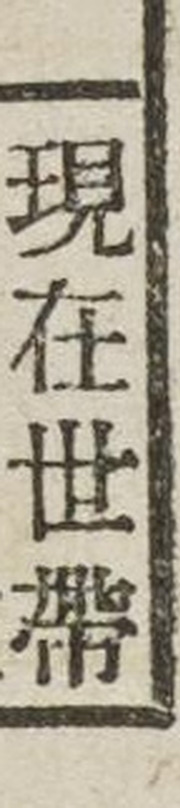現在世帯
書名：震災被害状況並救護施設概要
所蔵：東京大学地震研究所図書室 Earthquake Research Institute Library, The University of Tokyo, JAPAN
